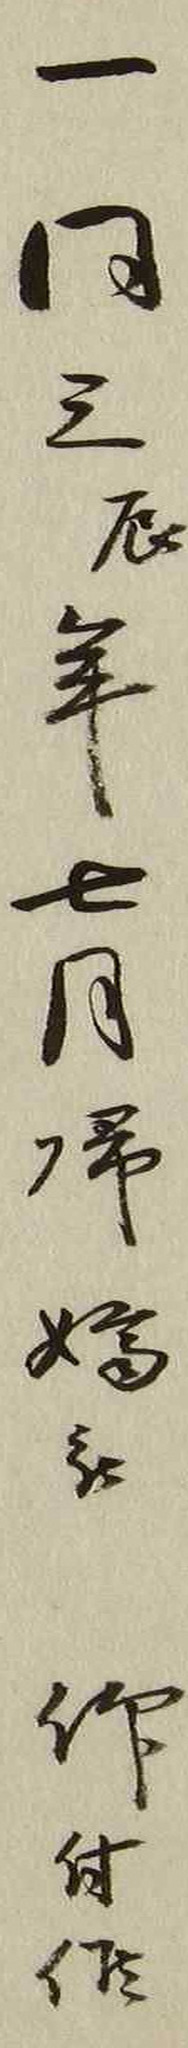一同三辰年七月帰嫡被仰付候
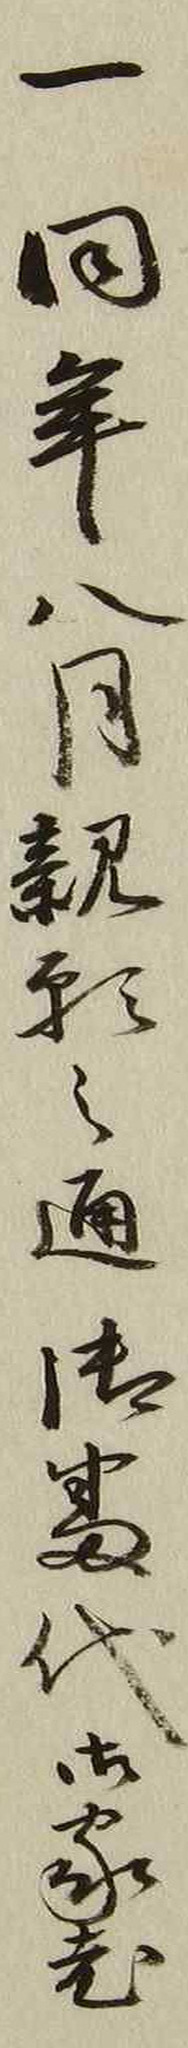一同年八月親願之通御番代御家老
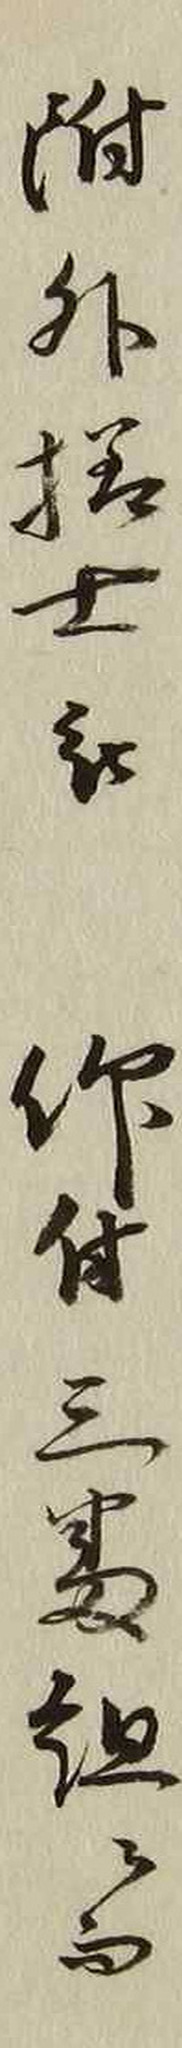附外様士被仰付三番組ニ而
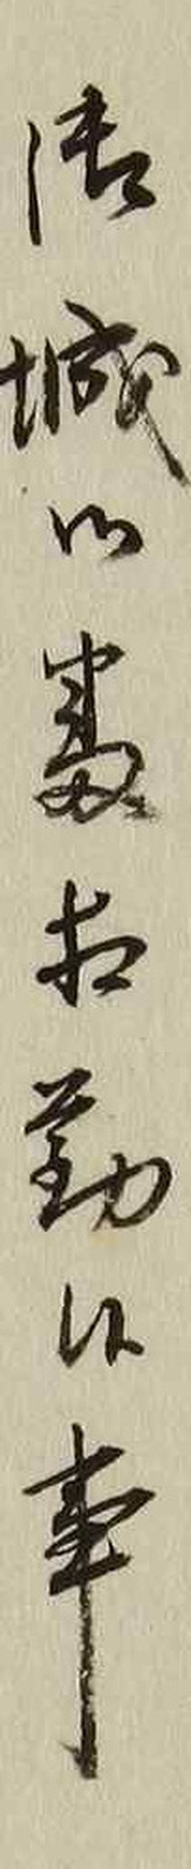御城御番相勤候事
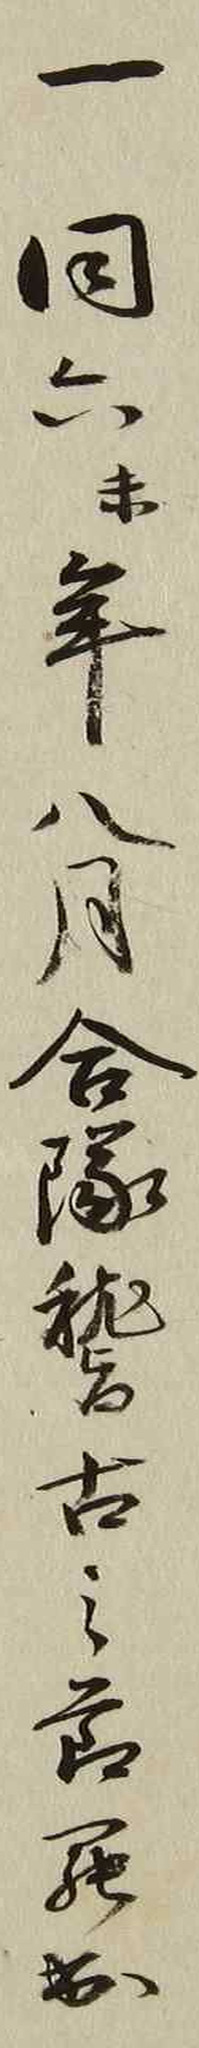一同六未年八月合隊稽古之節罷出
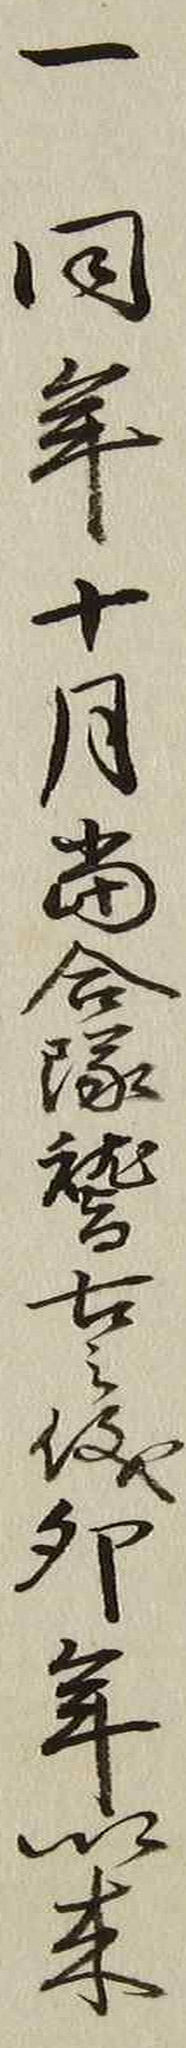一同年十月当合隊稽古之儀卯年以来
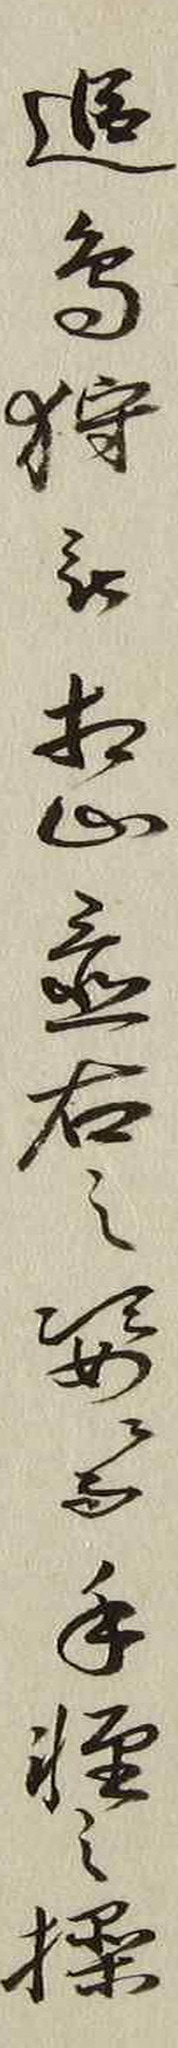追鳥狩被相止置右之姿ニ而手軽之操
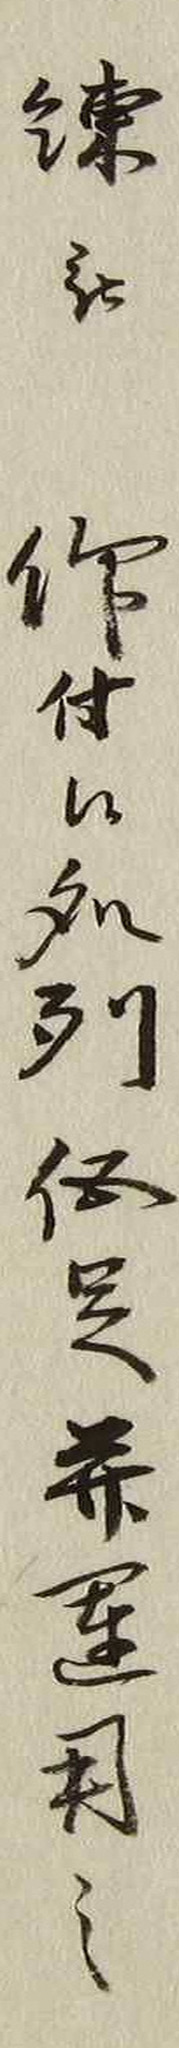練被仰付候処列伍足並運用之
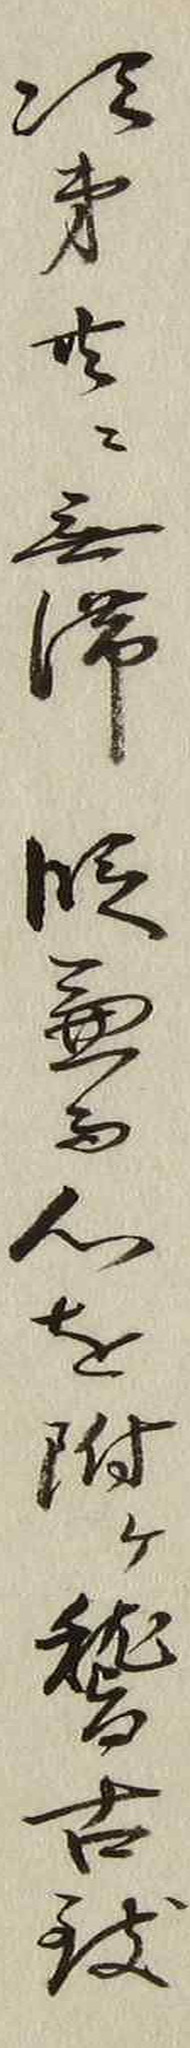次第共ニ無滞段兼而心を附ケ稽古致
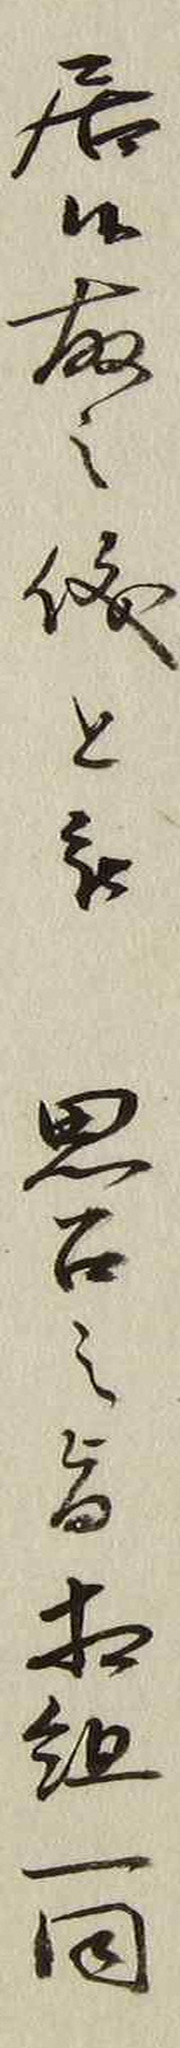居候故之儀と被思召之旨相組一同
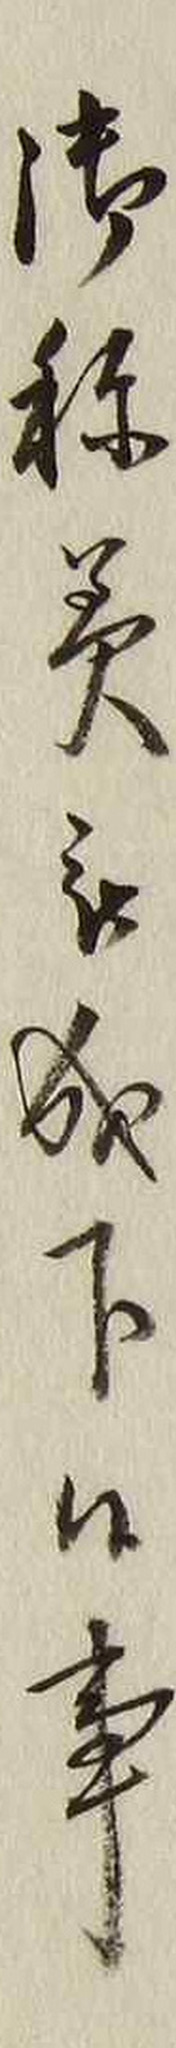御称美被成下候事
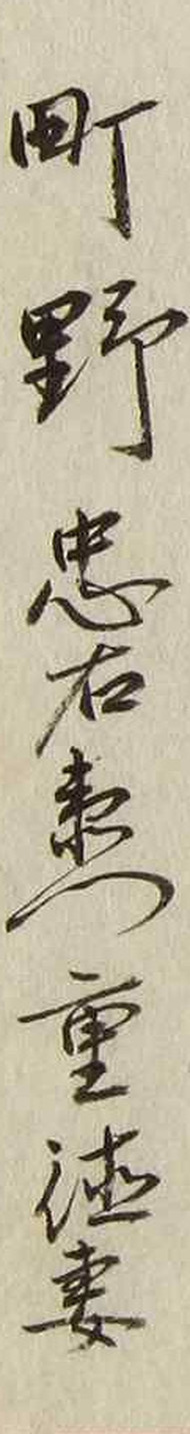女町野忠右衛門重徳妻

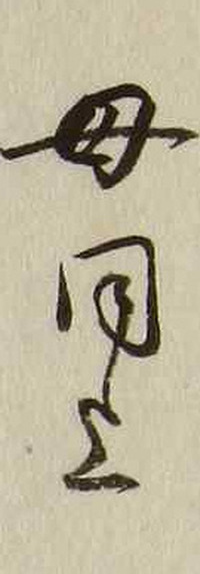母同上
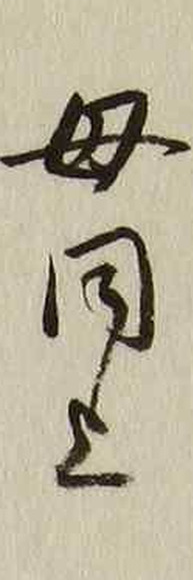母同上
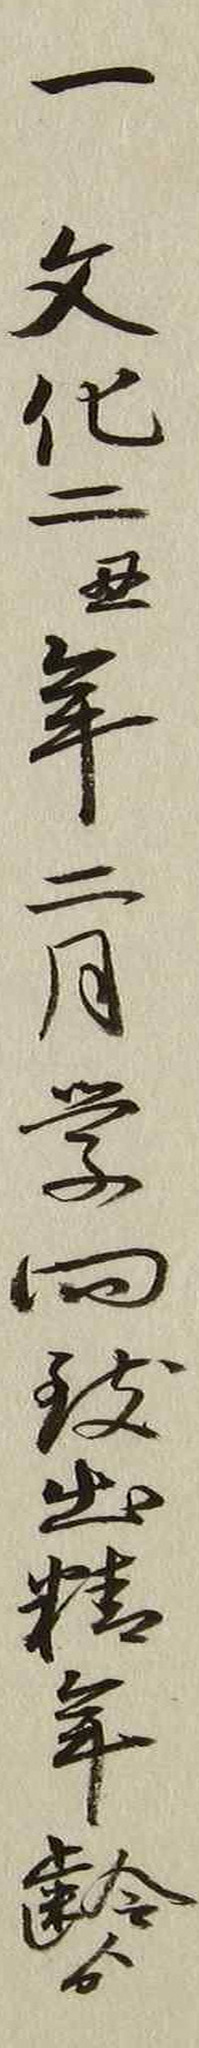一文化二丑年二月学問致出精年齢ゟ
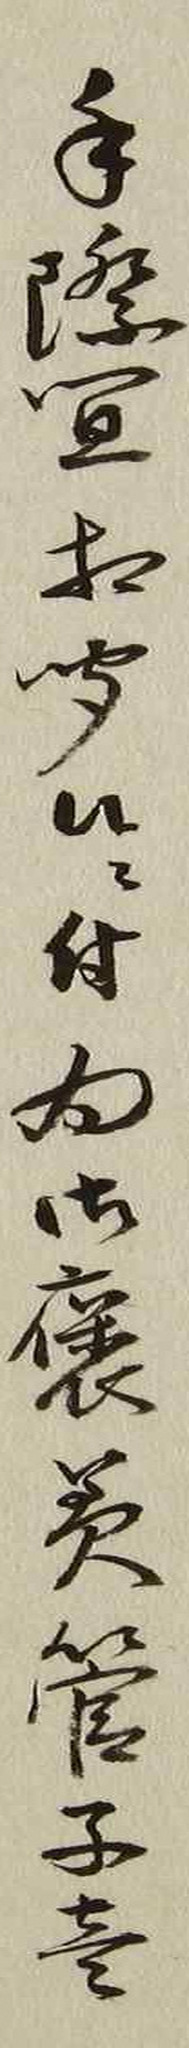手際宜相聞候ニ付為御褒美管子壱
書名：諸士系譜　巻之149　そ之部2
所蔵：会津若松市立会津図書館
